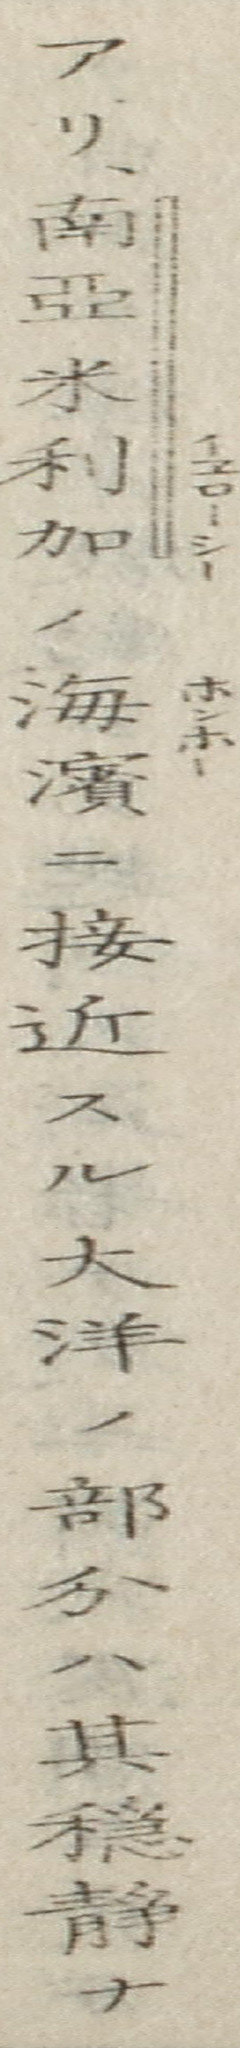アリ、南亜米利加ノ海浜ニ接近スル大洋ノ部分ハ其穏静ナ
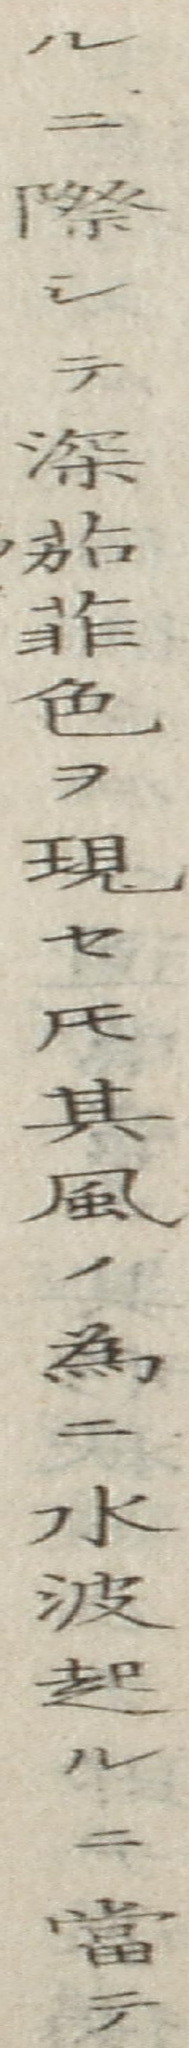ルニ際シテ深茄菲色ヲ現セトモ其風ノ為ニ水波起ルニ當テ
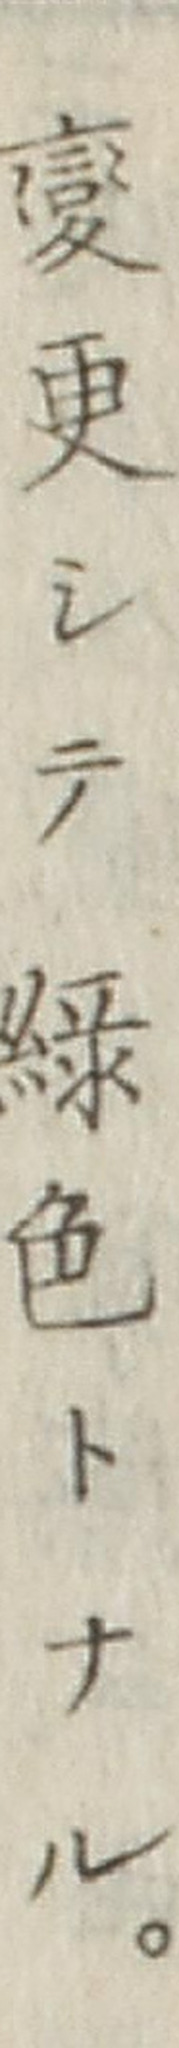変更シテ緑色トナル。
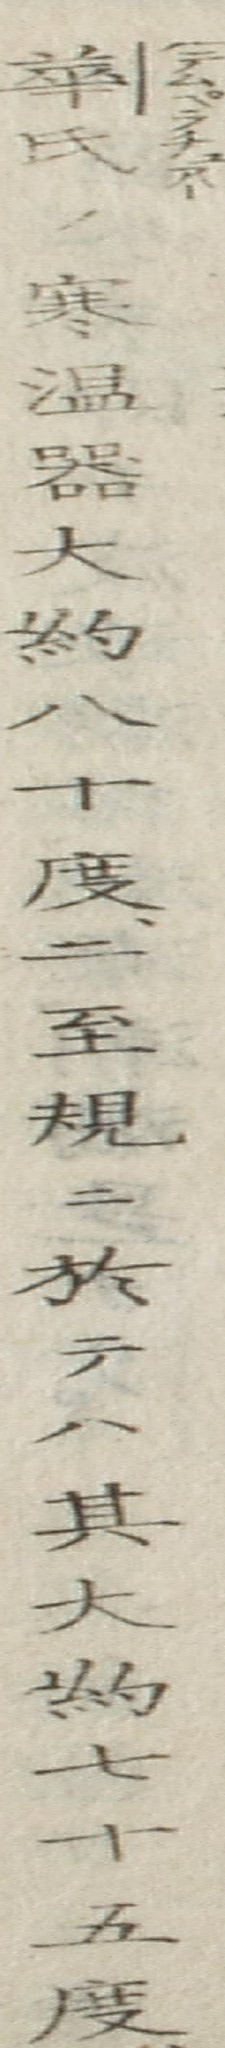華氏ノ寒温器大約八十度ニ至規ニ於テハ其大約七十五度、
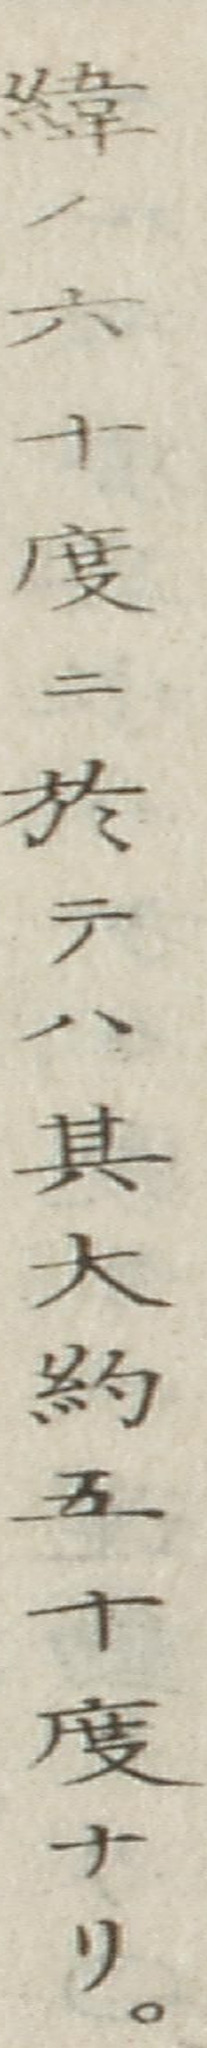緯ノ六十度ニ於テハ其大約五十度ナリ。
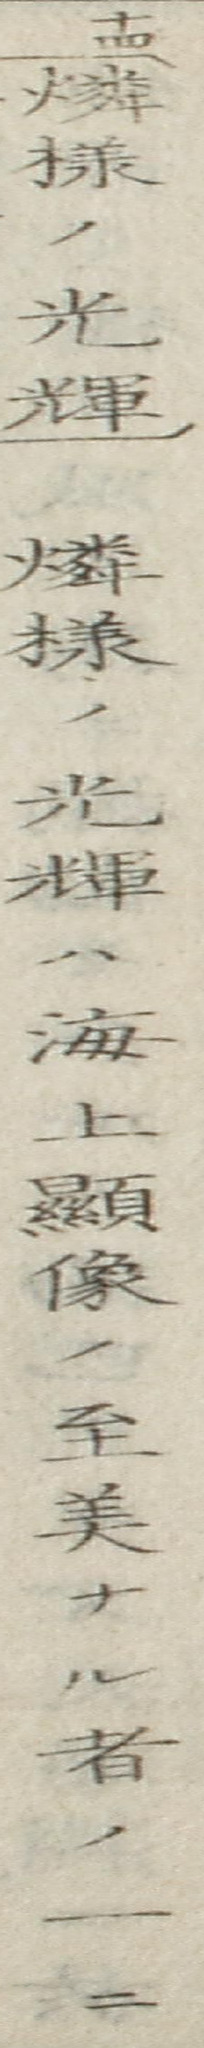十四〔燐様ノ光輝〕燐様ノ光輝ハ海上顕像ノ至美ナル者ノ一ニ
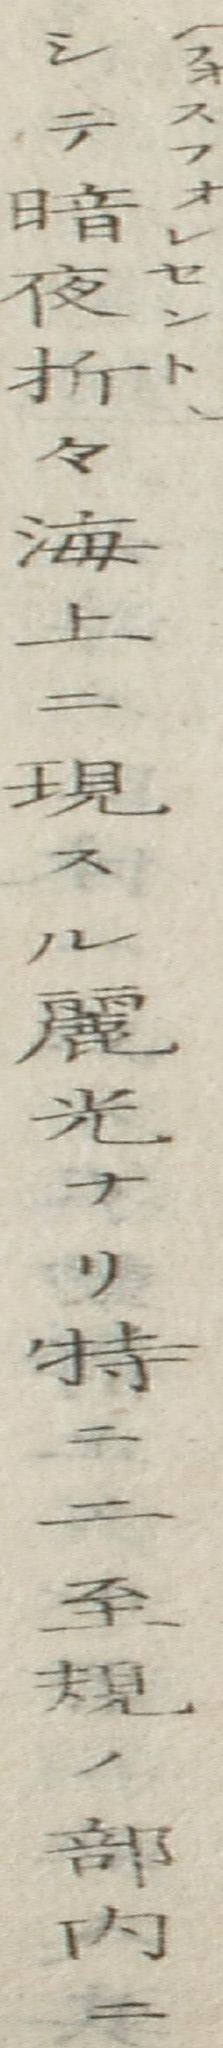シテ暗夜折々海上ニ現スル麗光ナリ特ニ二至規ノ部内ニ
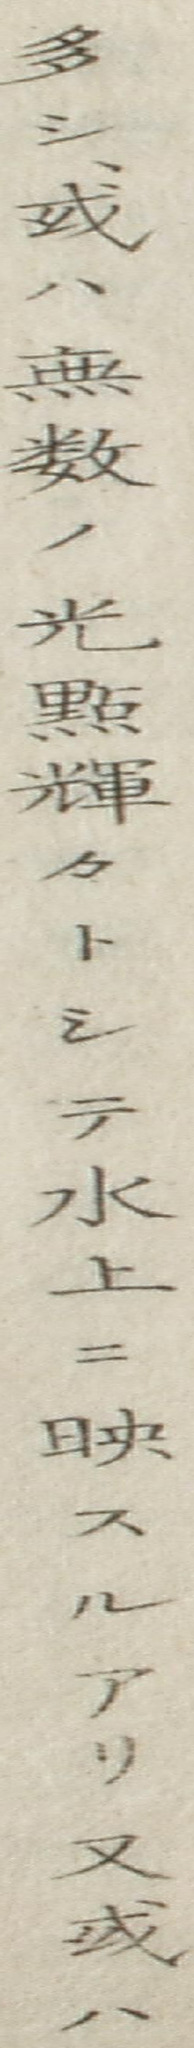多シ、或ハ無数ノ光点輝々トシテ水上ニ映スルアリ又或ハ
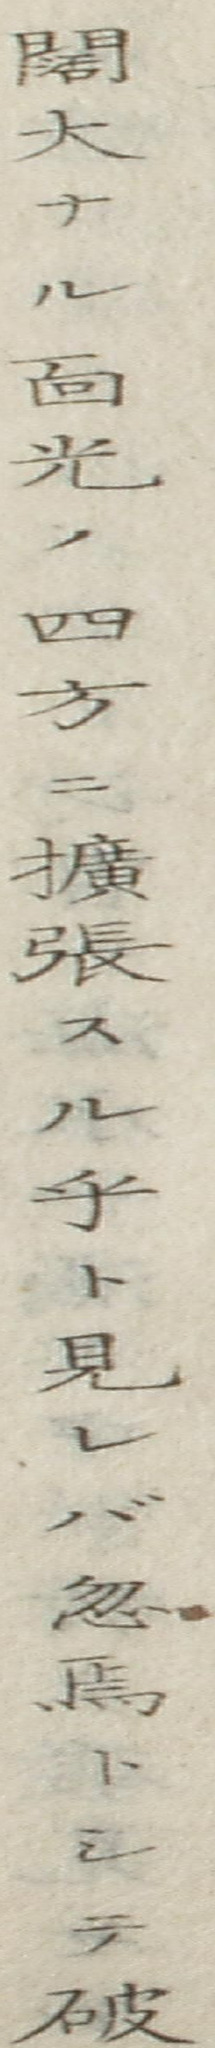闊大ナル面光ノ四方ニ拡張スル乎ト見レバ忽焉トシテ破
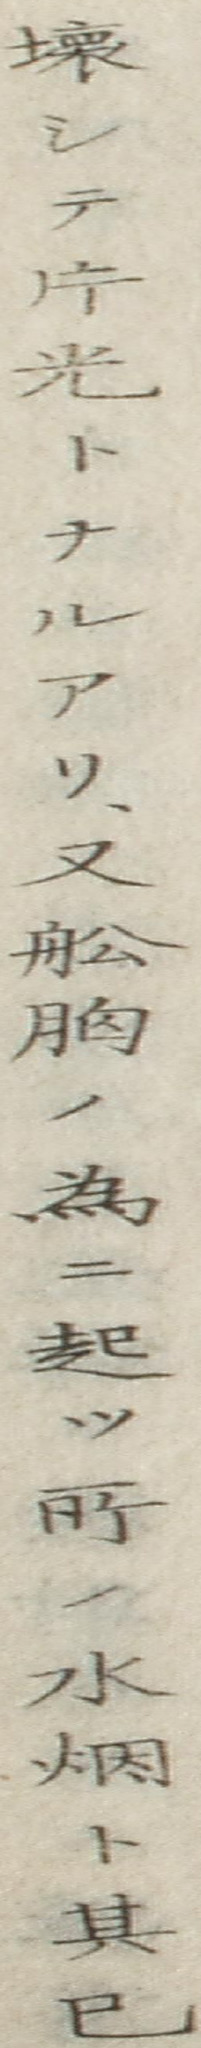壊シテ片光トナルアリ、又船胸ノ為ニ起ツ所ノ水煙ト其已
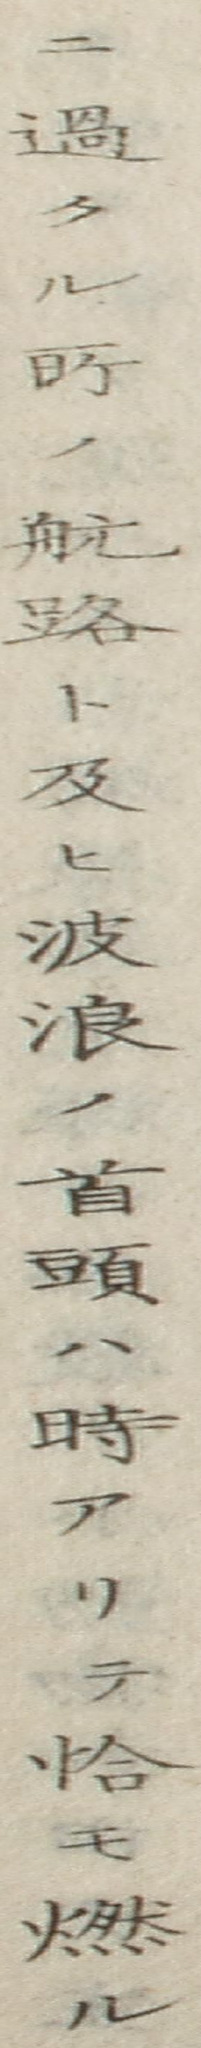ニ過クル所ノ航路ト及ヒ波浪ノ首頭ハ時アリテ恰モ燃ル

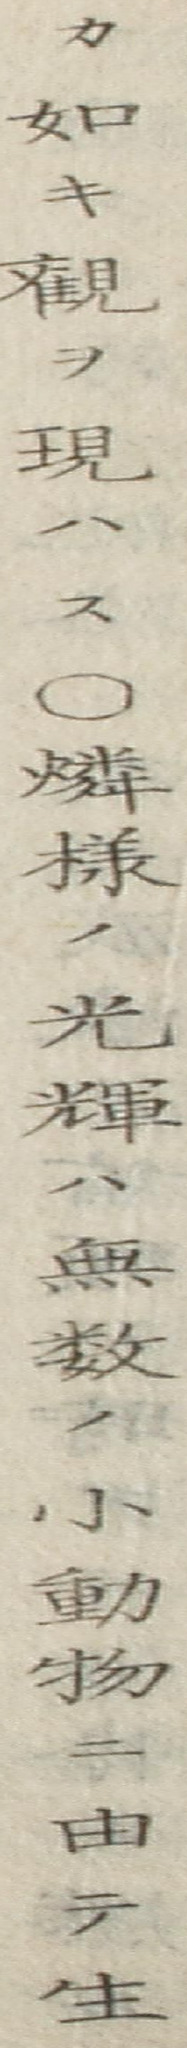カ如キ観ヲ現ハス○燐様ノ光輝ハ無数ノ小動物ニ由テ生
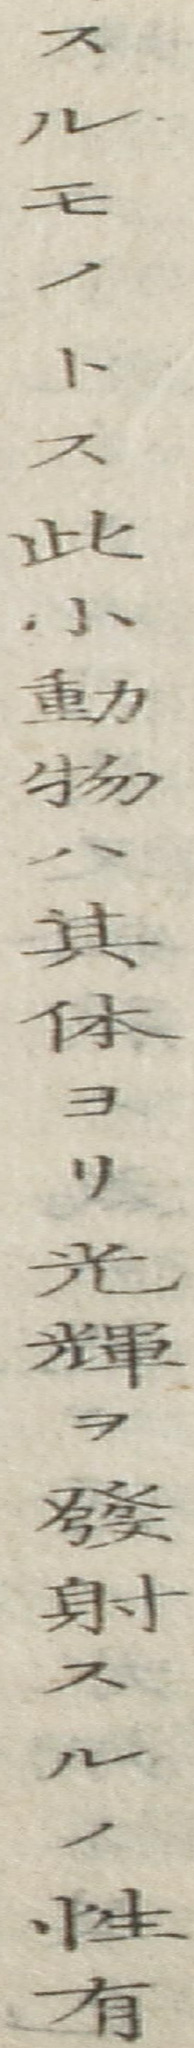スルモノトス此小動物ハ其体ヨリ光輝ヲ発射スルノ性有
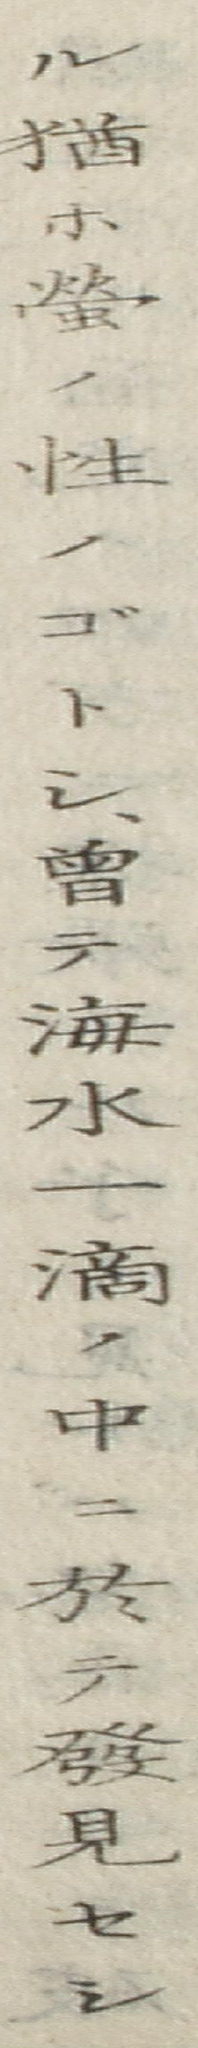ル猶ホ蛍ノ性ノゴトシ、曾テ海水一滴ノ中ニ於テ発見セシ
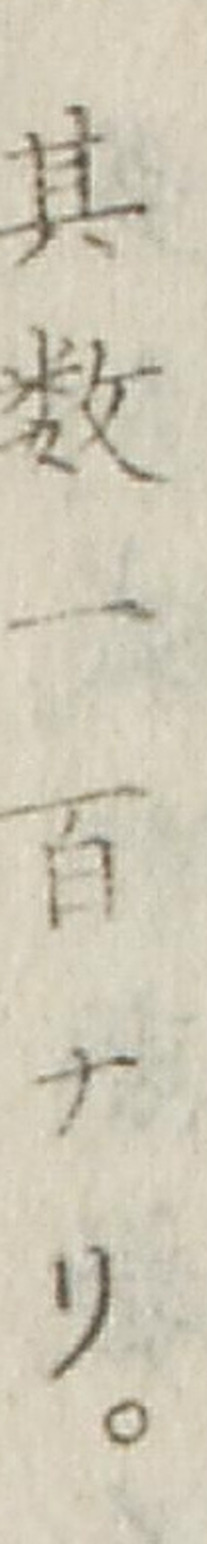其数一百ナリ。
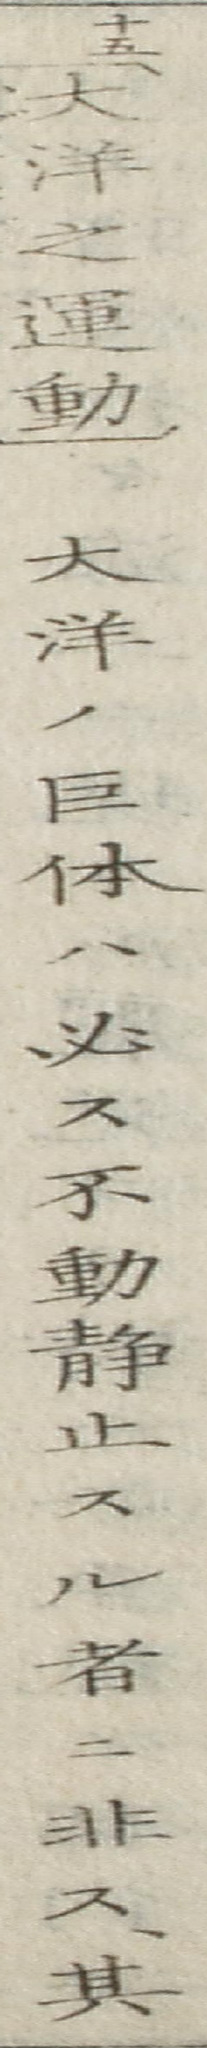十五〔大洋之運動〕大洋ノ巨体ハ必ス不動静止スル者ニ非ス、其
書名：地形論　巻二
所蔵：東京大学地震研究所図書室 Earthquake Research Institute Library, The University of Tokyo, JAPAN
